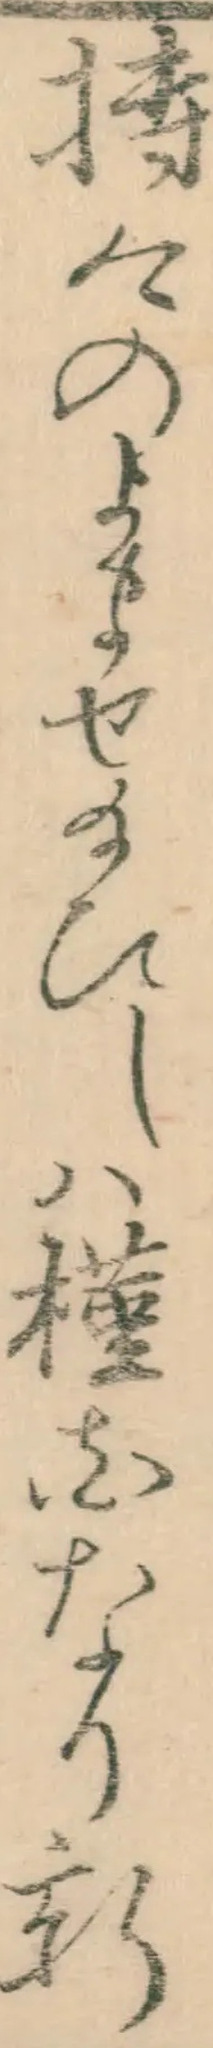持公のよませ給ひしハ槿花なり新
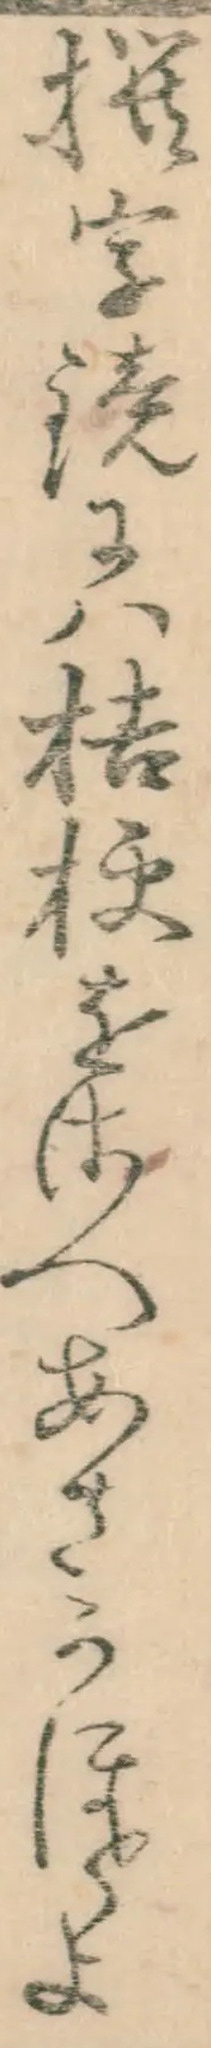撰字鏡にハ桔梗をさへあさかほよ
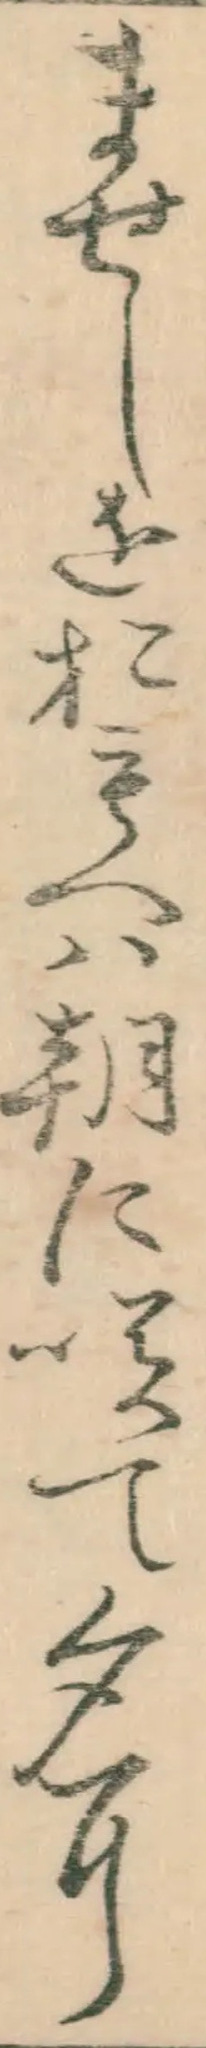ませしをおもへハ朝に咲て夕に
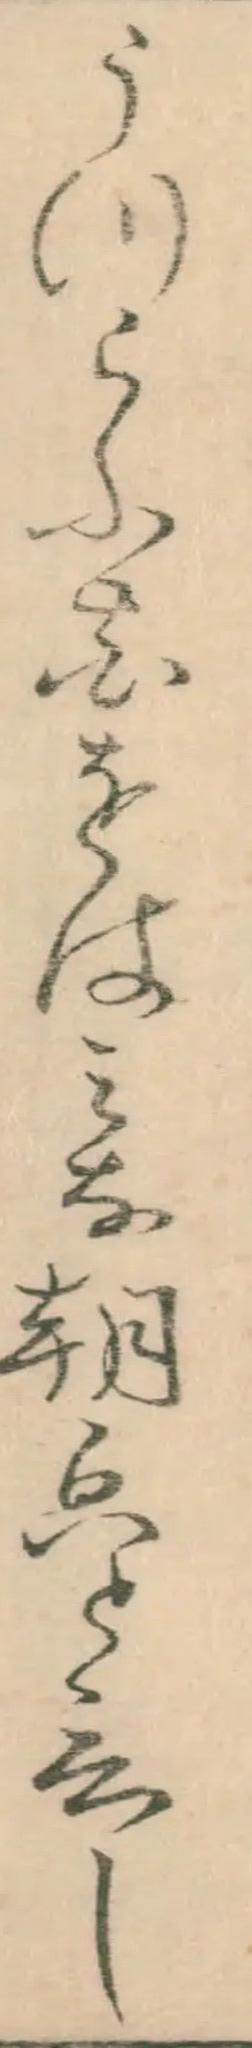うつらふ花をはミな朝貌と云し
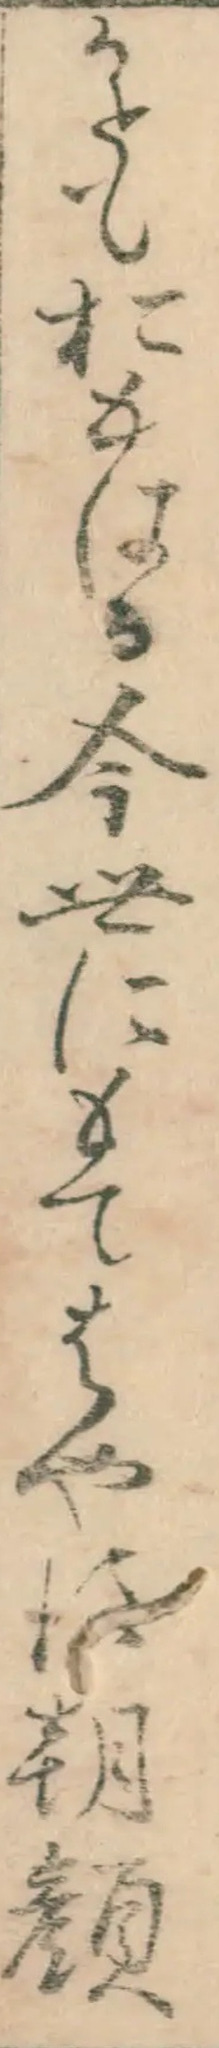かともおもはる今世にもてはや朝顔

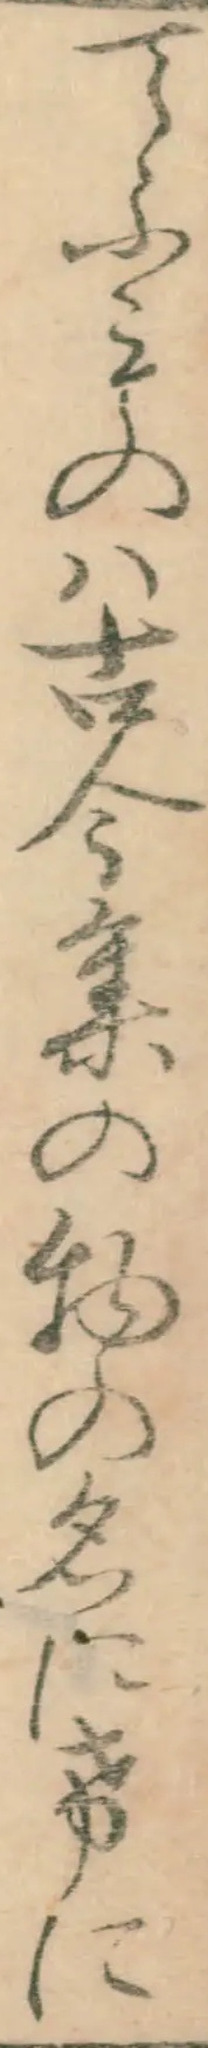てふものハ古今集の物の名に希に
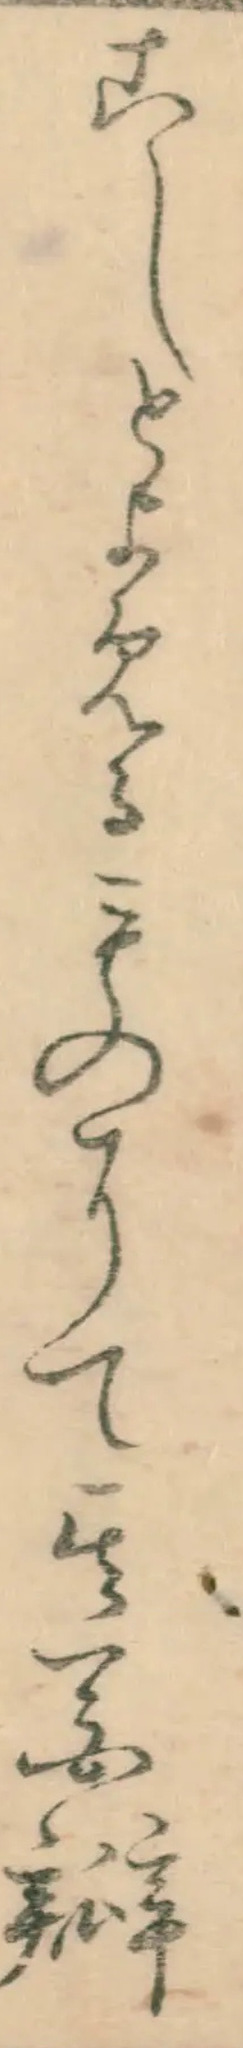こしとよめるものにて其花ハ辨
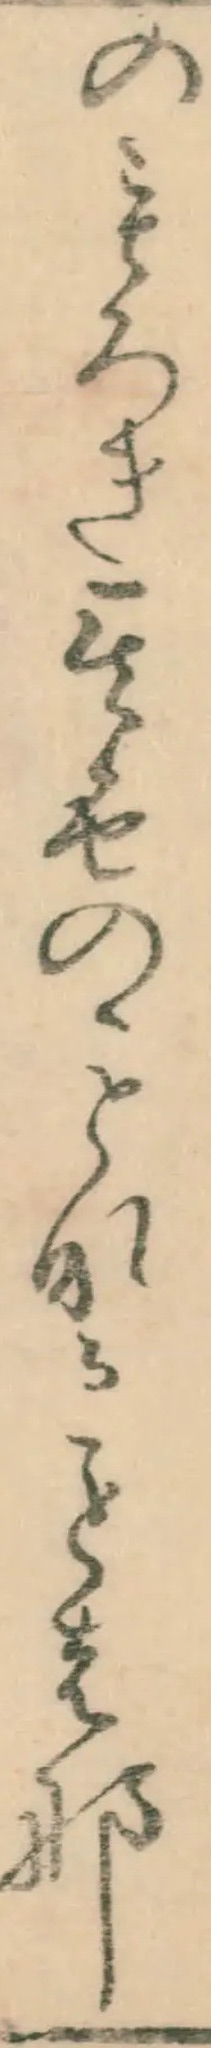のもろき其色のことなるを志那
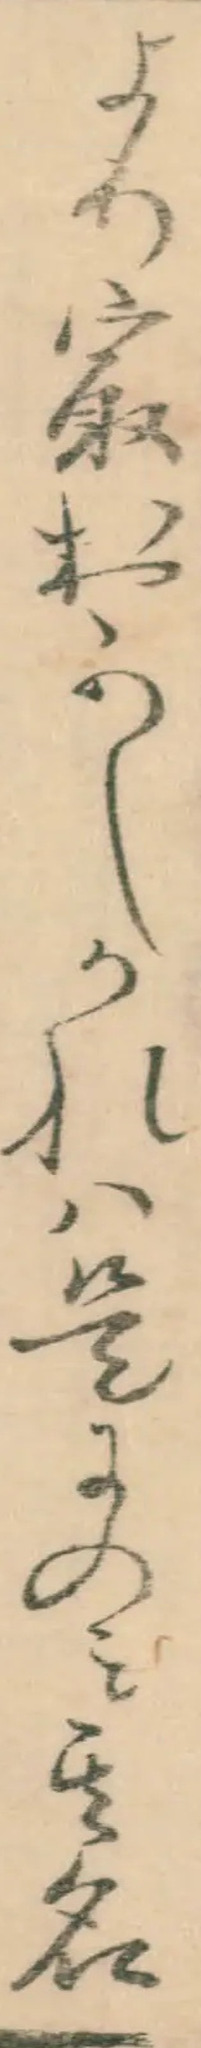より最おかしかれハ是にのミ其名
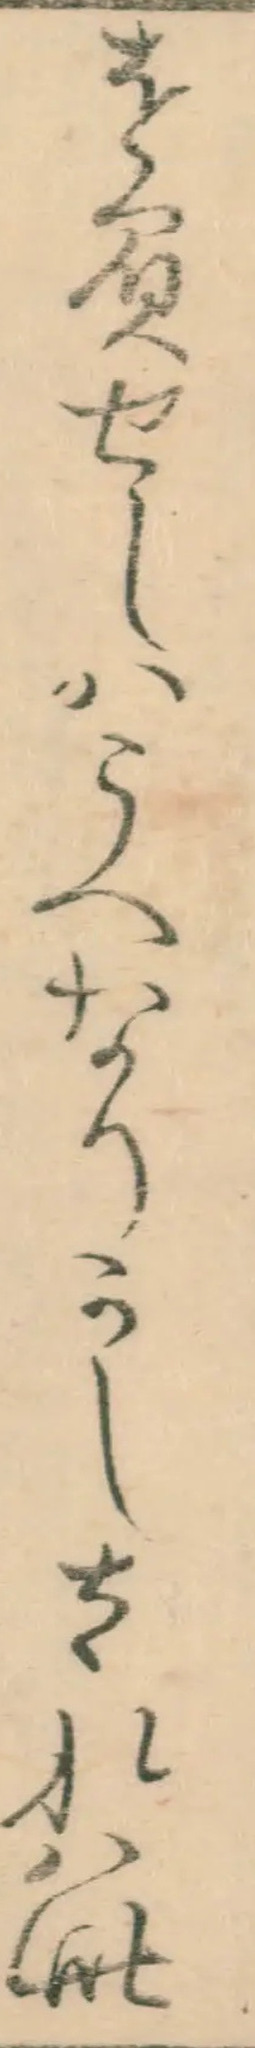を負セしハこへなりかしされハ此
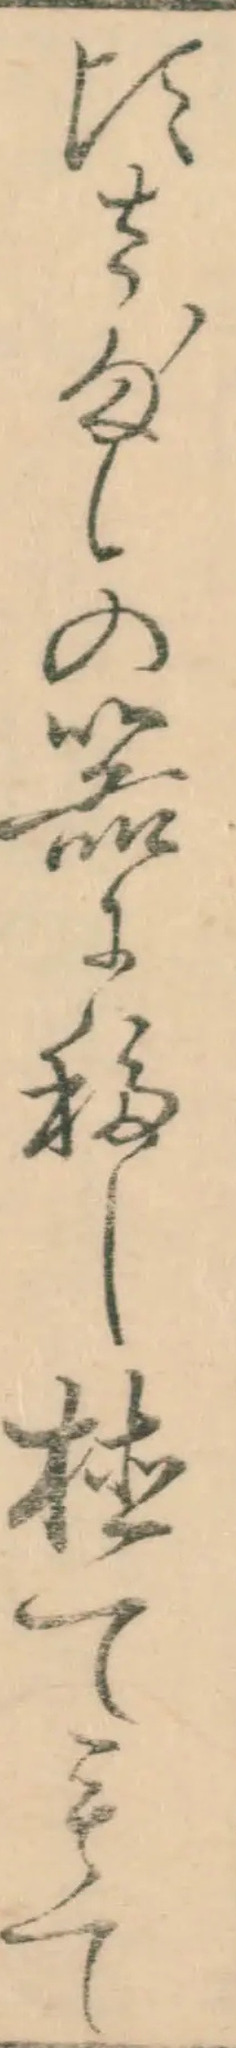頃さの器に移し植てもて
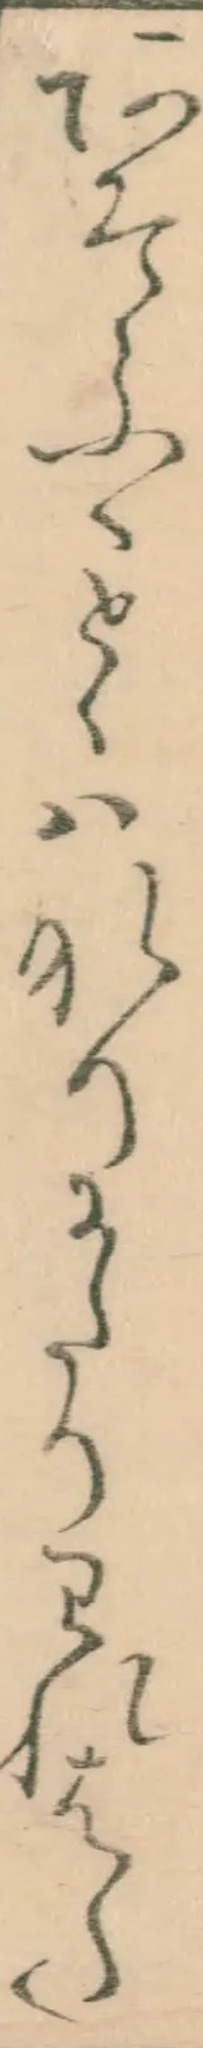あそふことくハなりにたりわれはたゝ
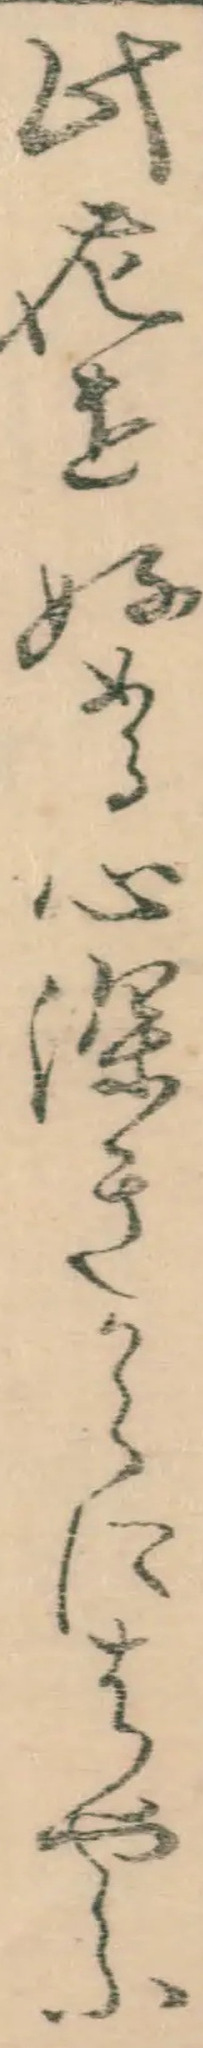此花を好める心深きからにはやふ
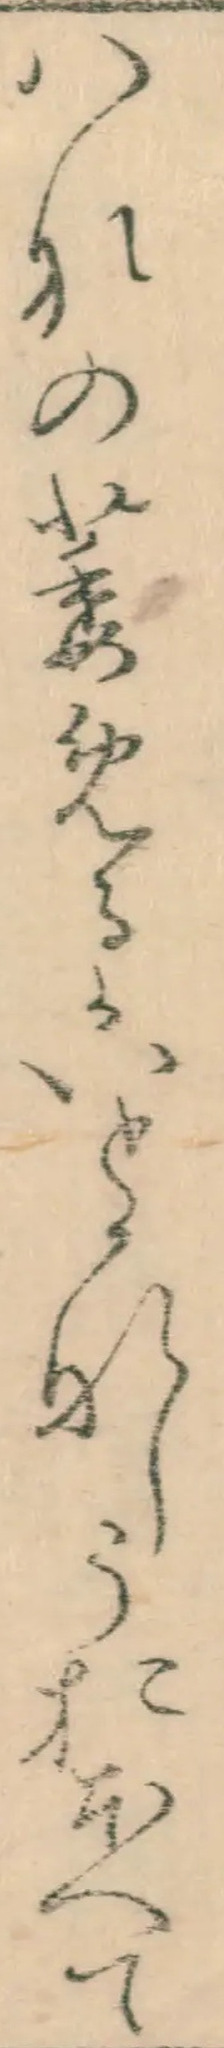ハなの萎めるかいとかなしうおほへて
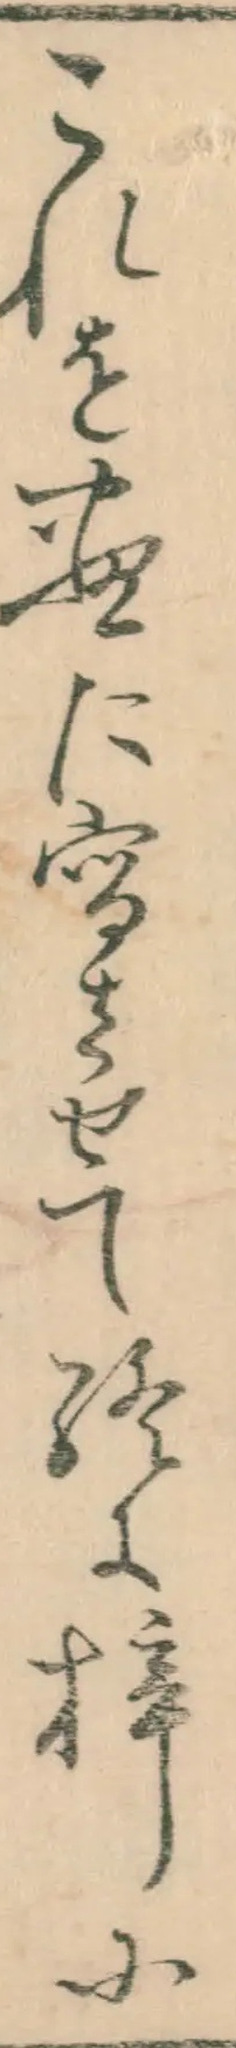これを画に写させて終にに
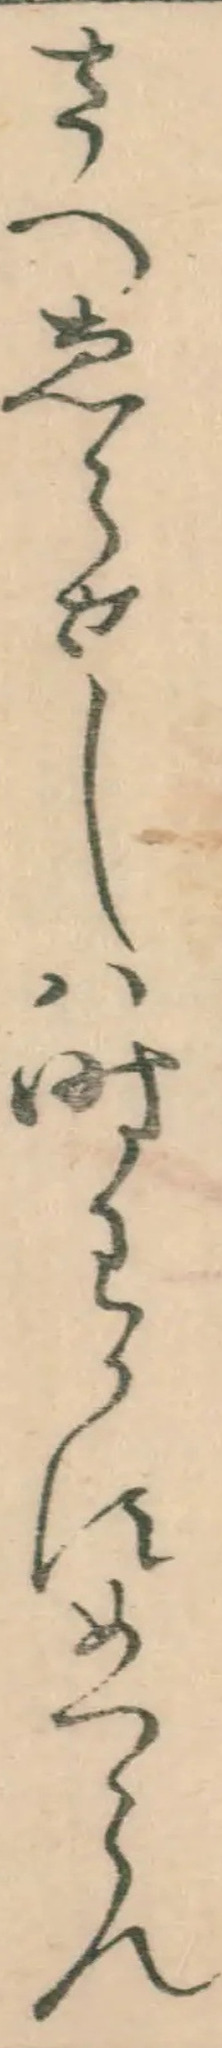さへえらせしハ時わかすめつらん
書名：花壇朝顔通 2巻. [2]
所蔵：国立国会図書館 National Diet Library, JAPAN
